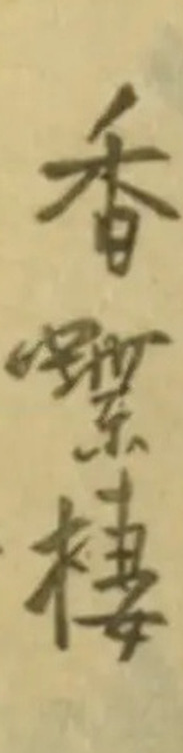香野楼
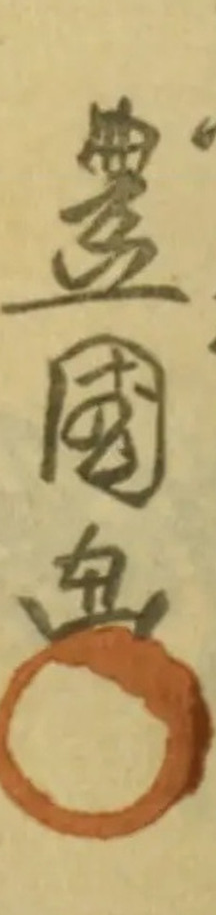豊國画
